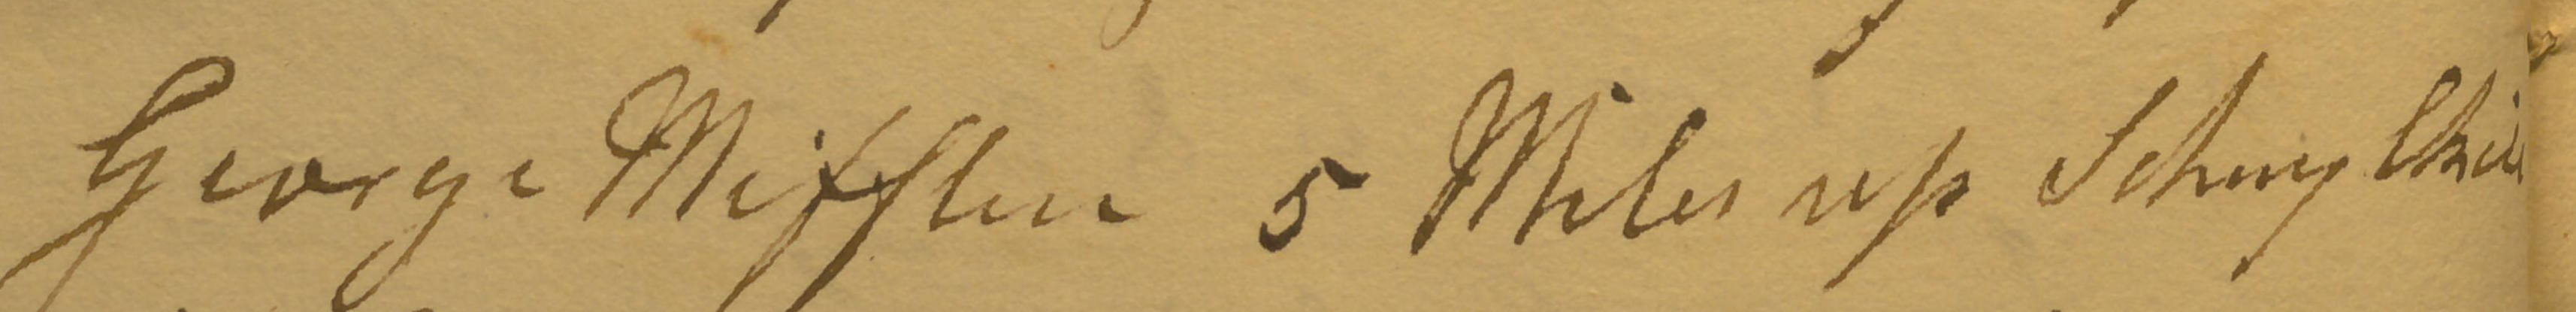George Mifflin 5 Miles up Schuylkil
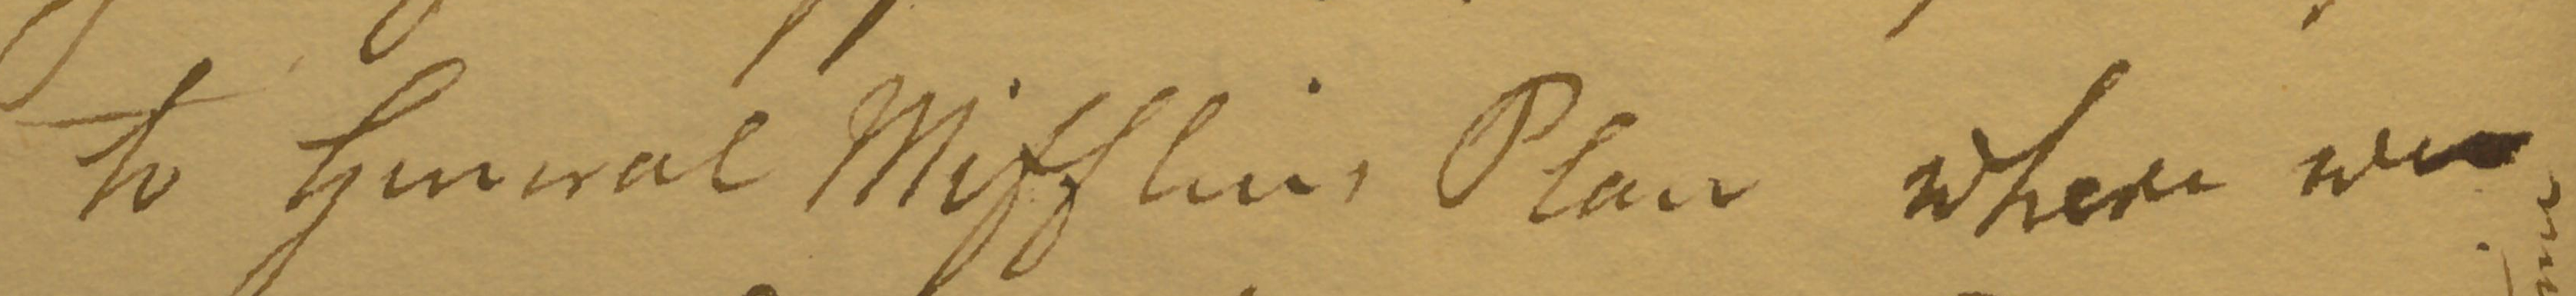to General Mifflins Place where we
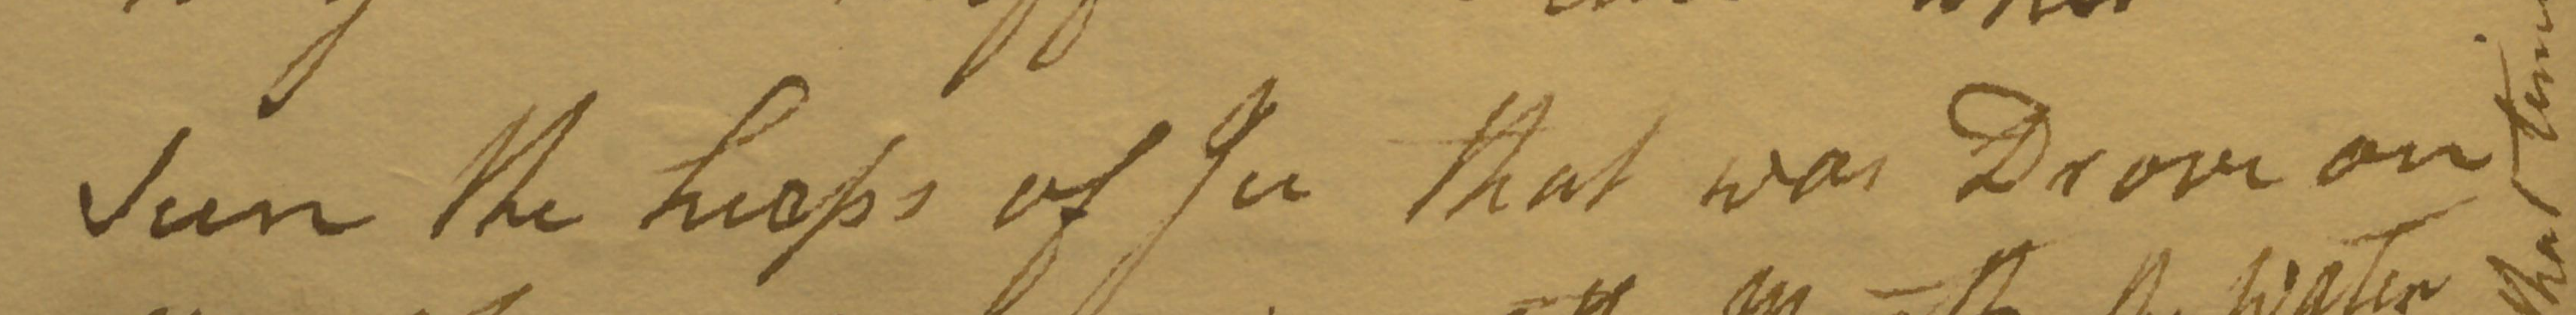seen the heaps of Ice that was Drove on
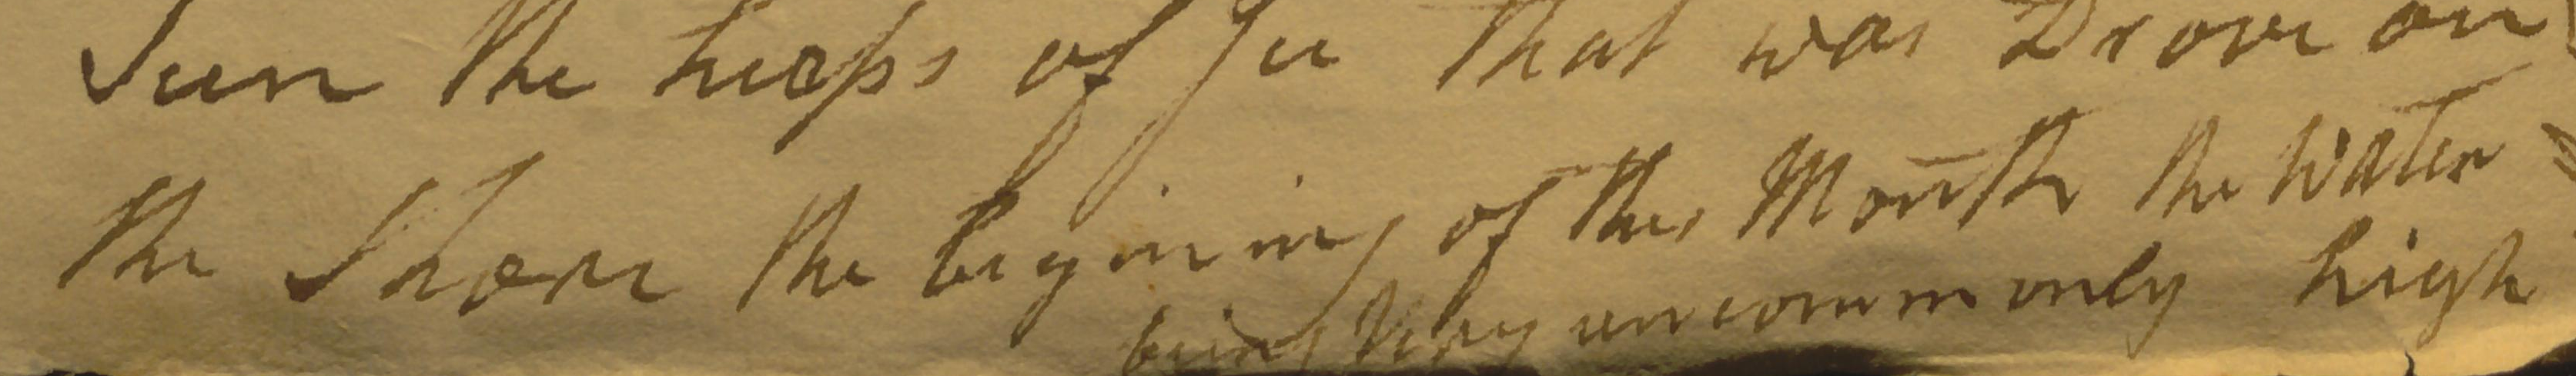the shore the beginning of this Month the Water
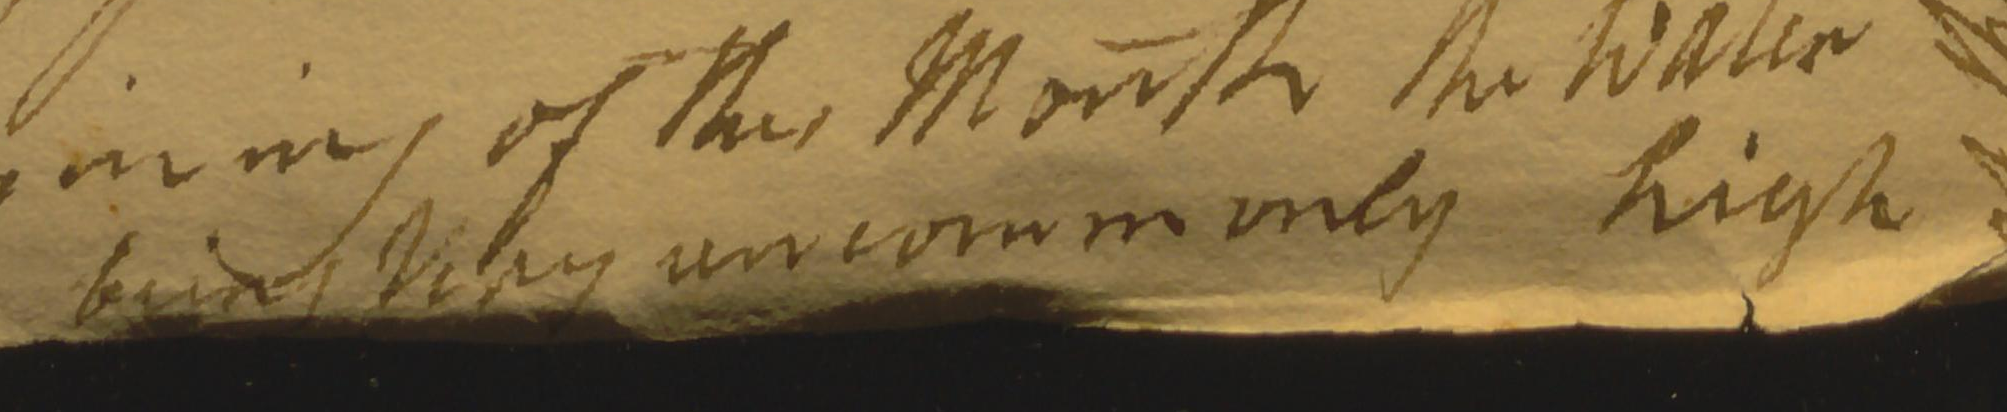being Very uncommonly high
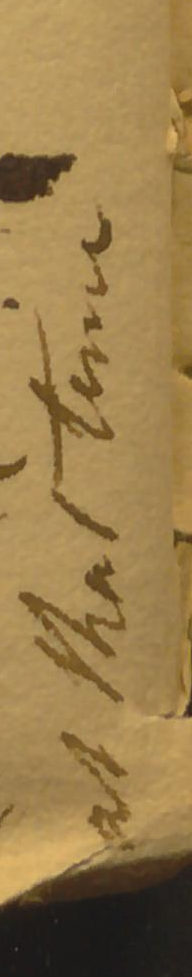at that time
